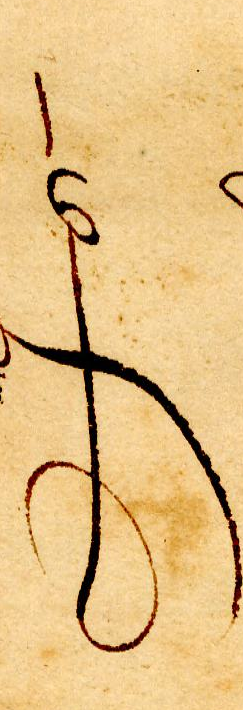For
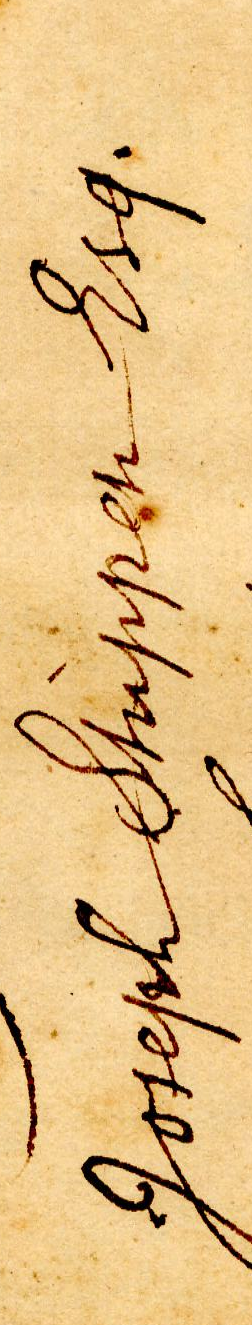Joseph Shippen Esq.
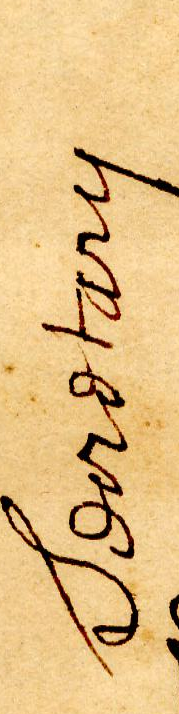Secretary
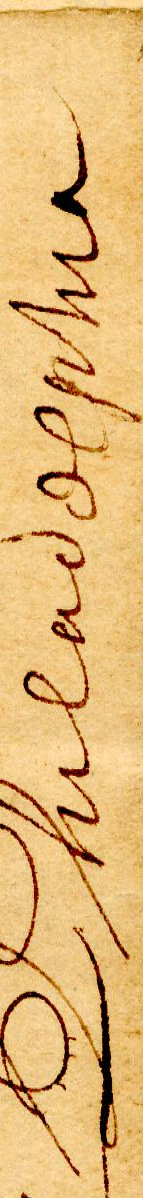Philadelphia
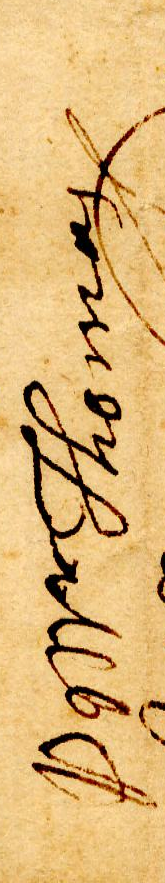per M^r Thomas
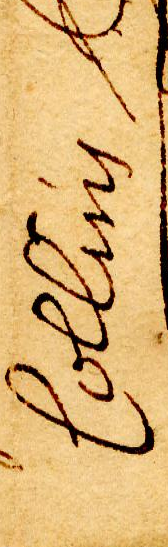Collins
